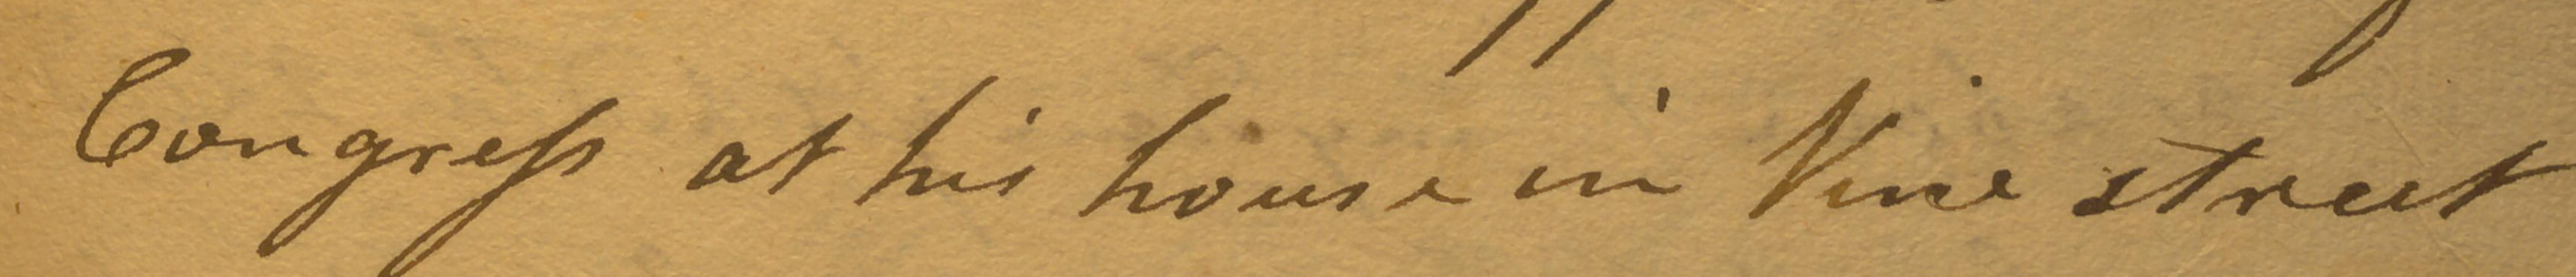Congress at his house in Vine street
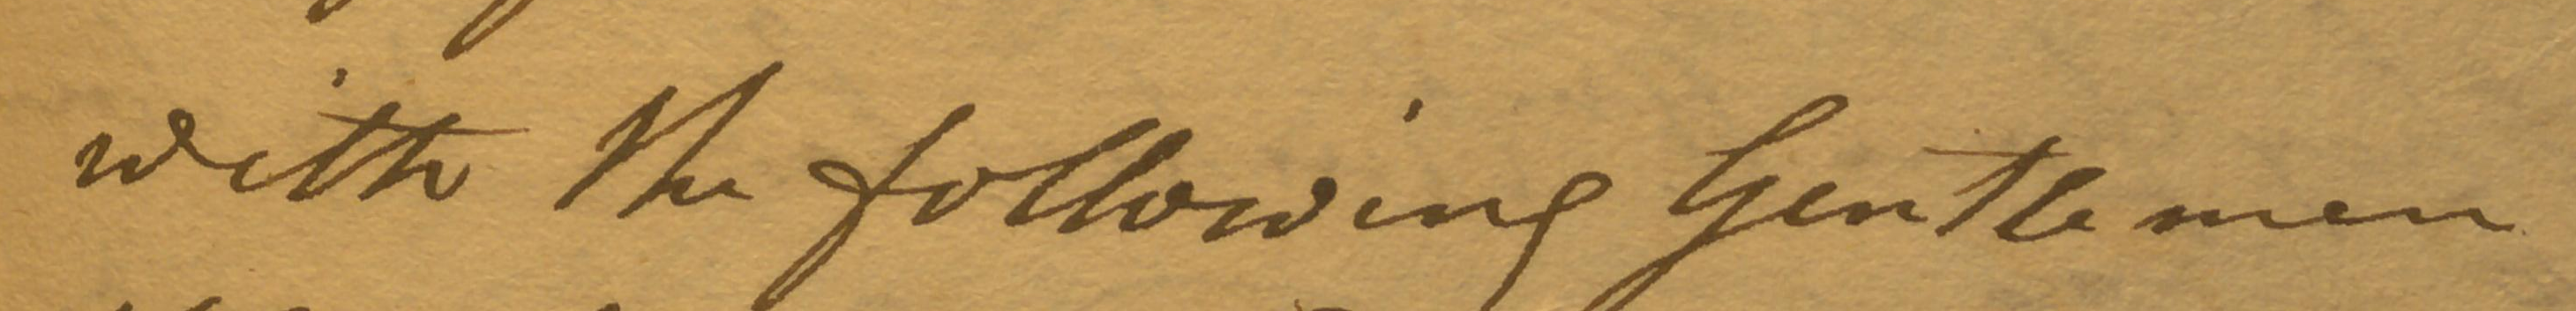with the following Gentle men
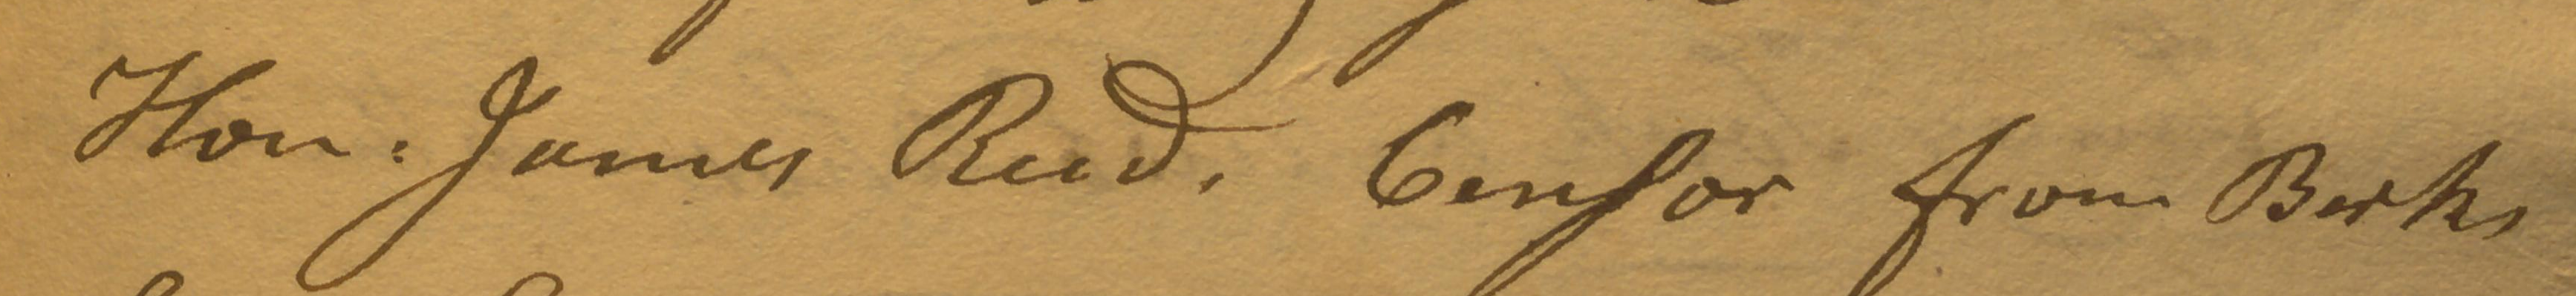Hon. James Reed. Censor from Berks
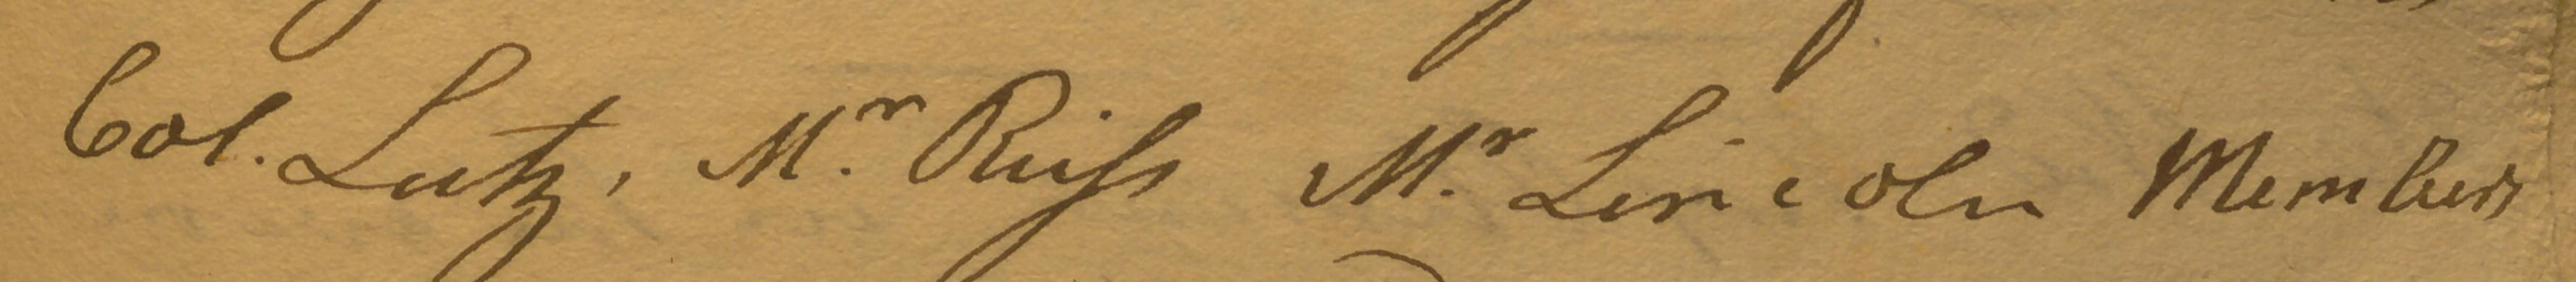Col. Lutz, M^r. Reiss M^r. Lincoln Member
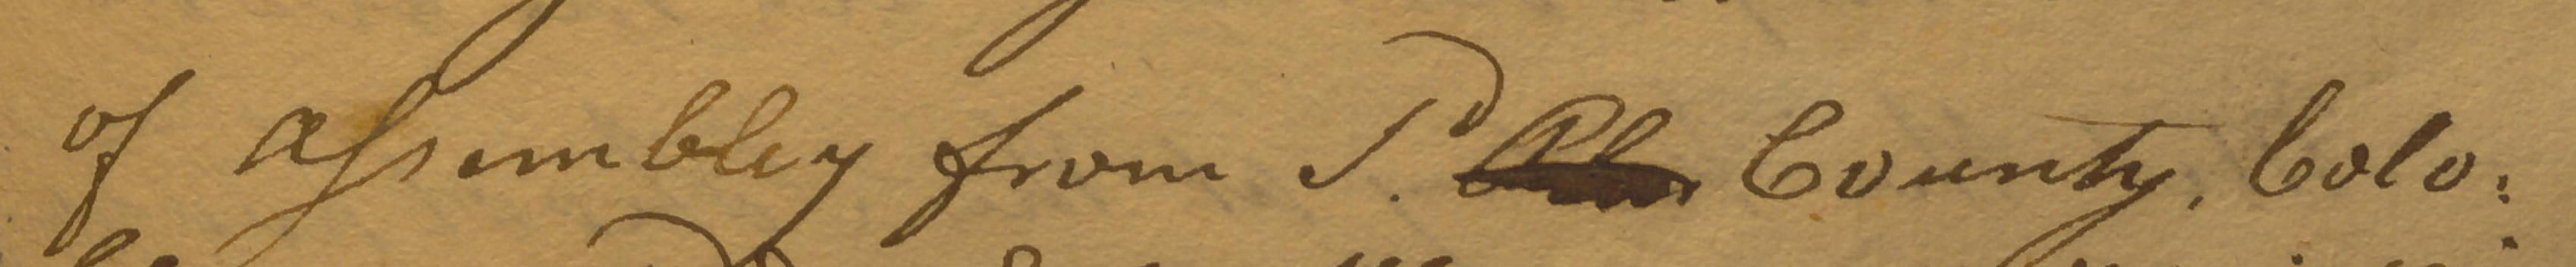of assembley from s^d. [Place] County, Colo:
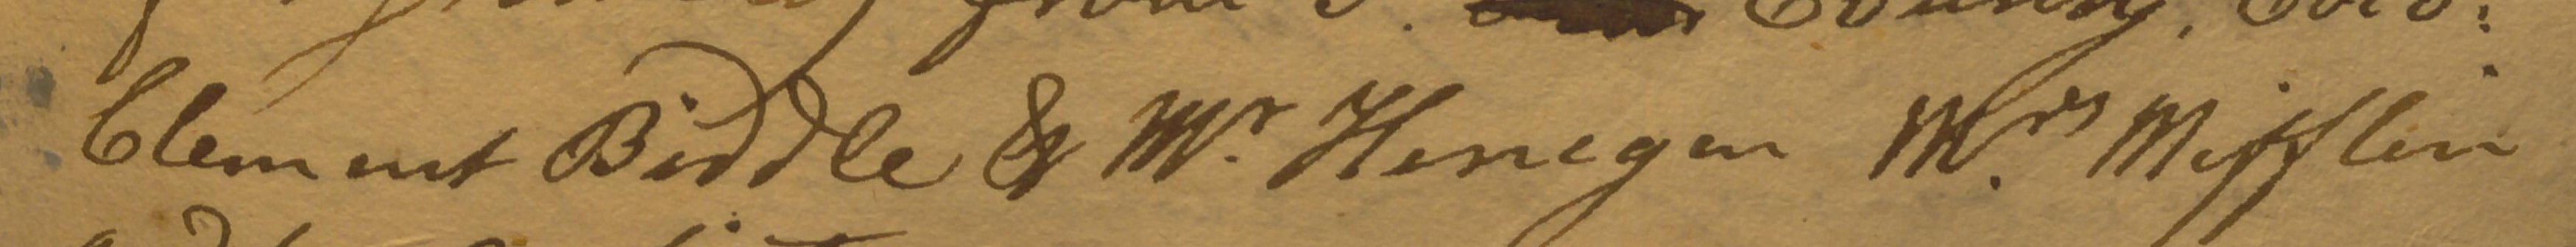Clement Biddle & M^r. Henegan M^rs. Mifflin
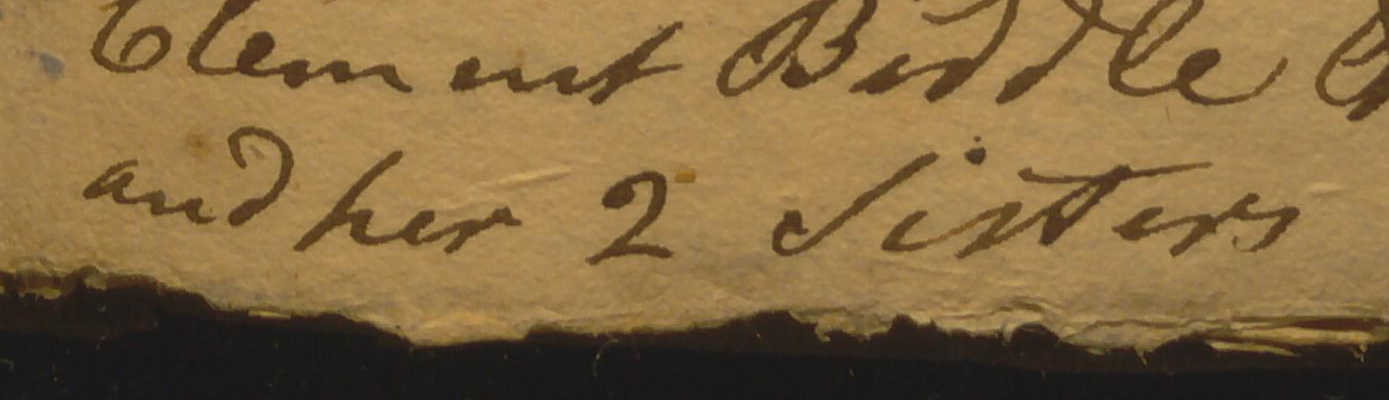and her 2 Sisters
